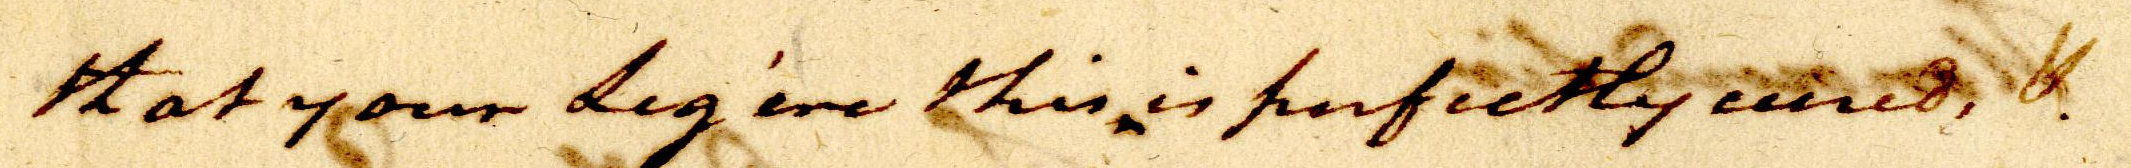that your Leg 'ere this is perfectly cured, &
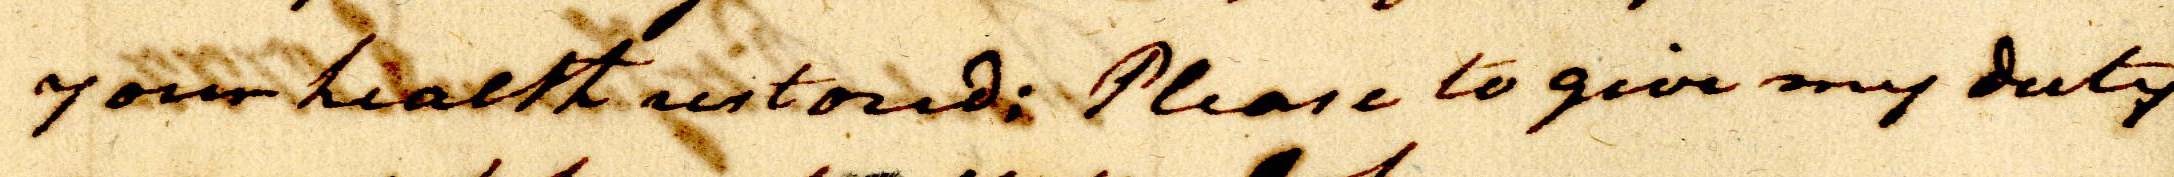your health restored: Please to give my duty
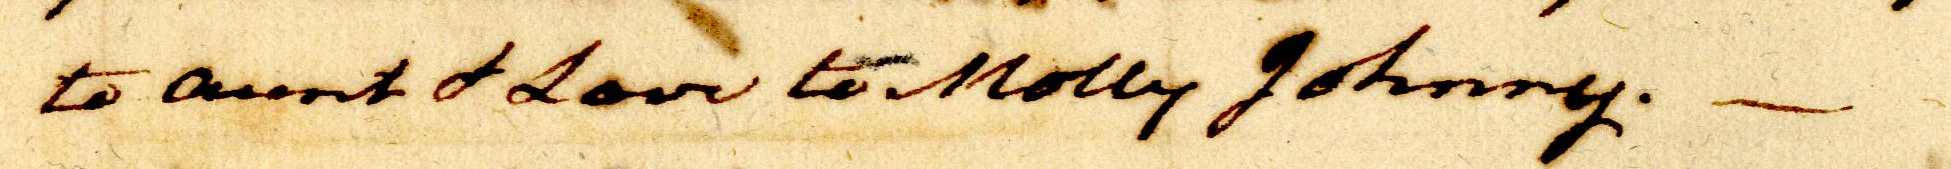to aunt & Love to Molly Johnny.-
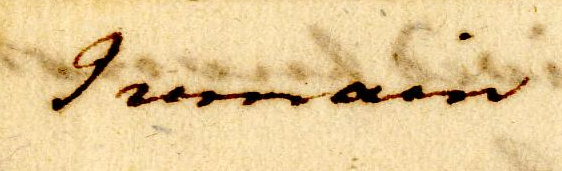I remain
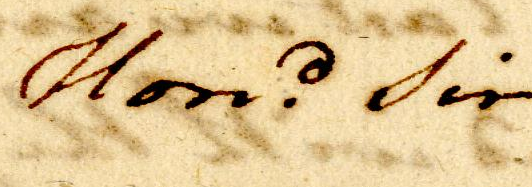Hon^d. Sir
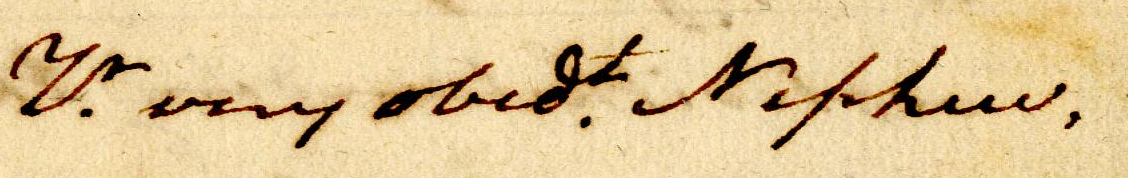Y^r. very obed^t. Nephew,
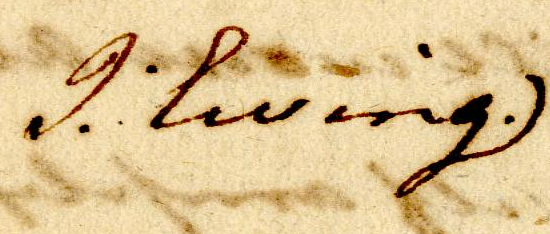J: Ewing.
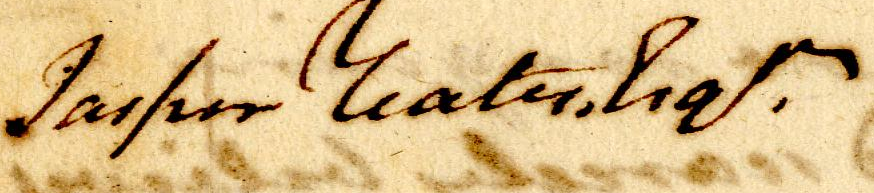Jasper Yeates Esq^r.
